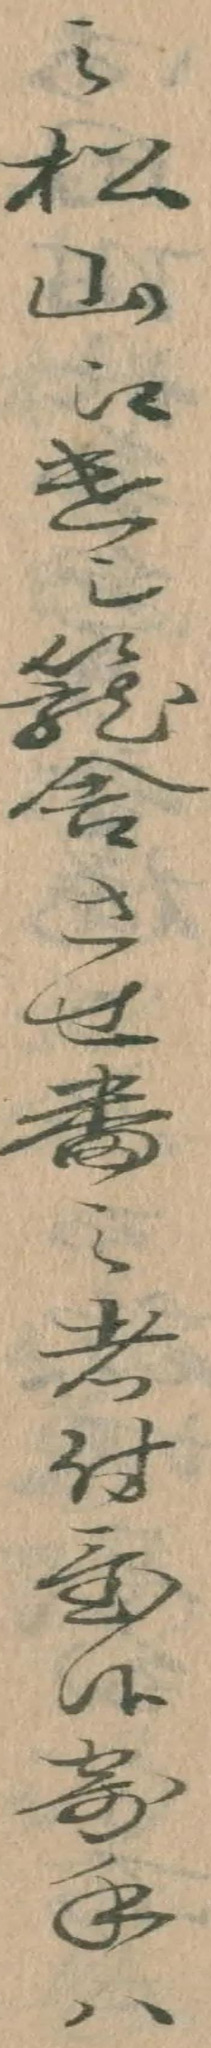之松山江遣し籠舎させ番之者付置候寄手は
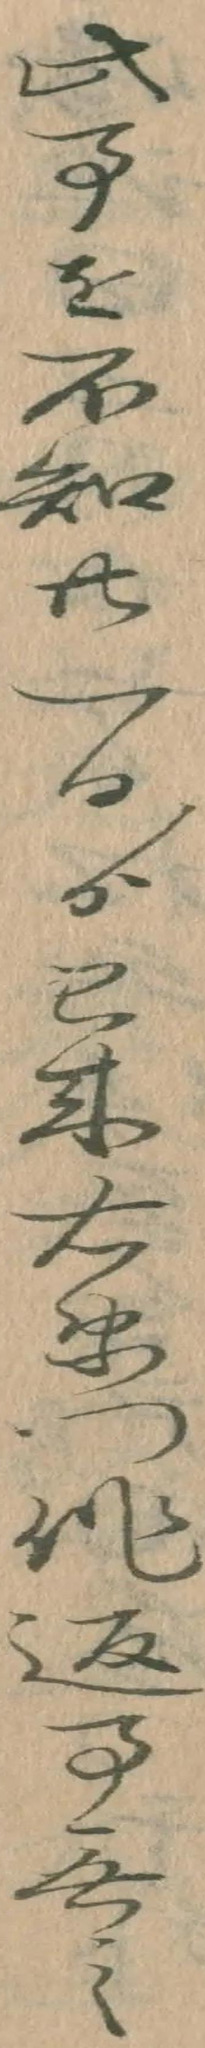此事を不知廿一日ゟ已来右衛門作返事無之
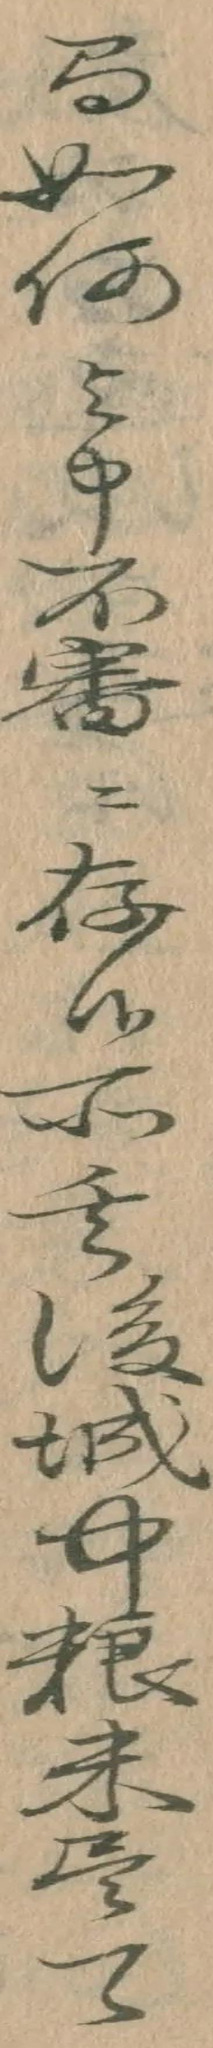間如何与申不審に存候所其後城中粮米尽て
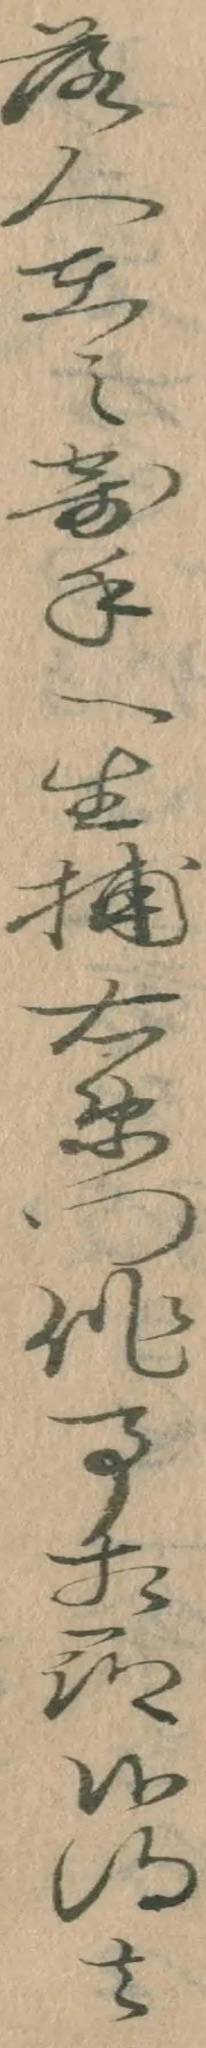落人在之寄手へ生捕右衛門作事相尋候得者
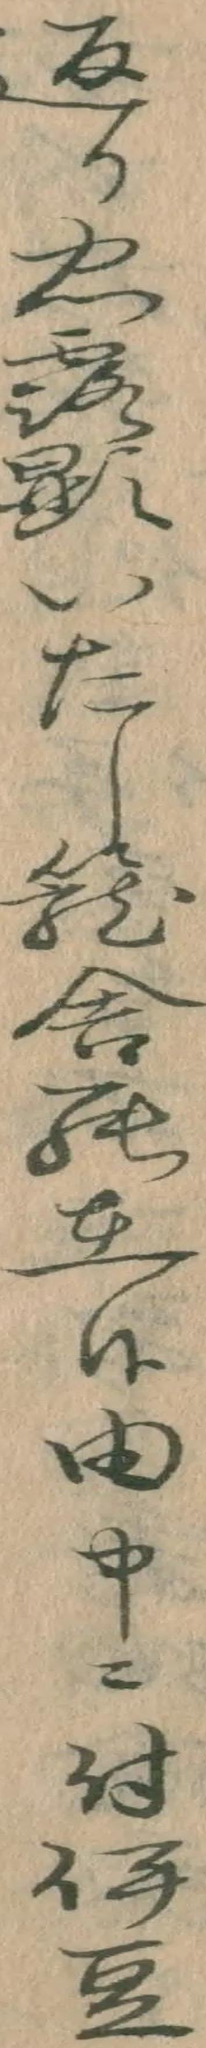返り忠露顕いたし籠舎罷在候由申に付伊豆
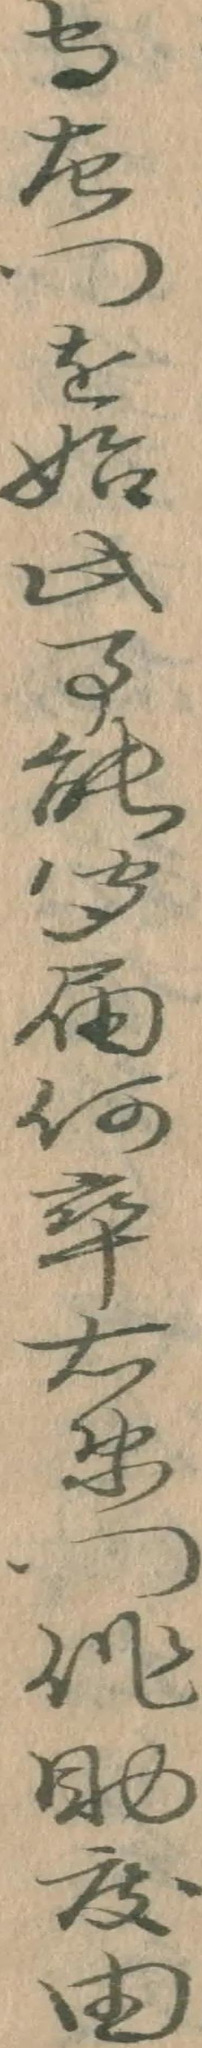守左門を始此事能聞届何卒右衛門作助度由
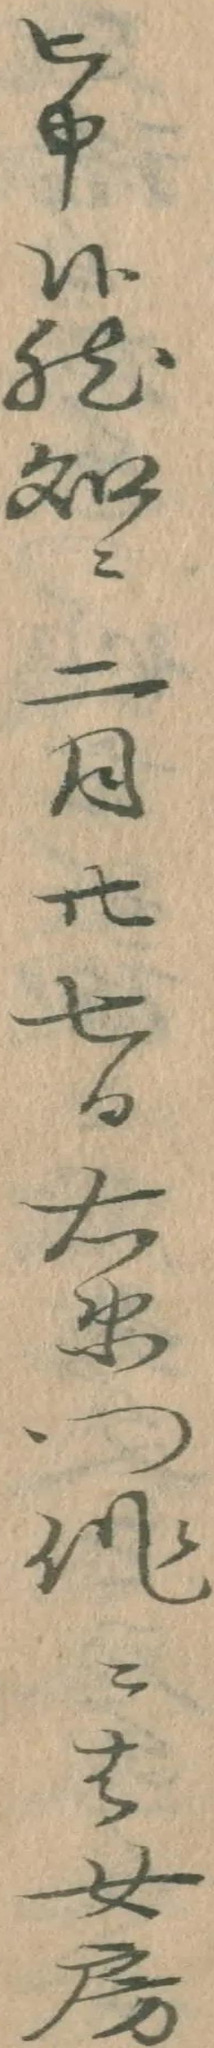被申候然処に二月廿七日右衛門作に者女房
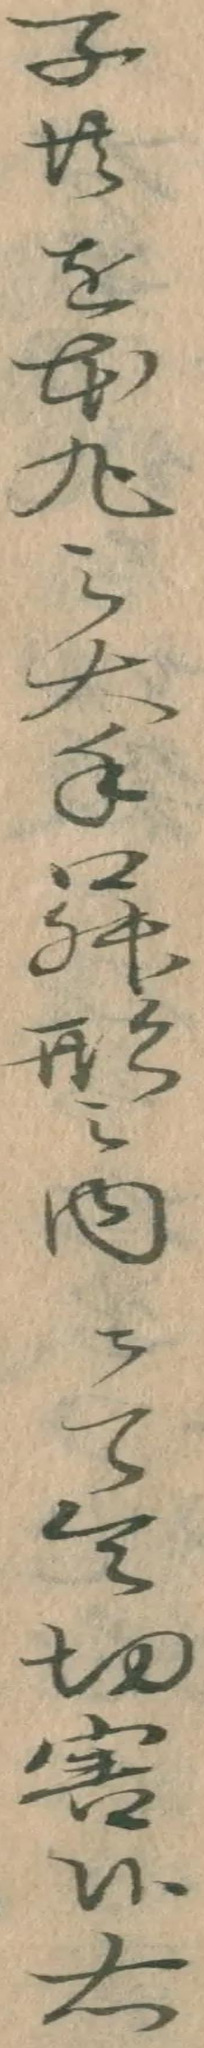子共を本丸之大手曻形之内にて令切害候右
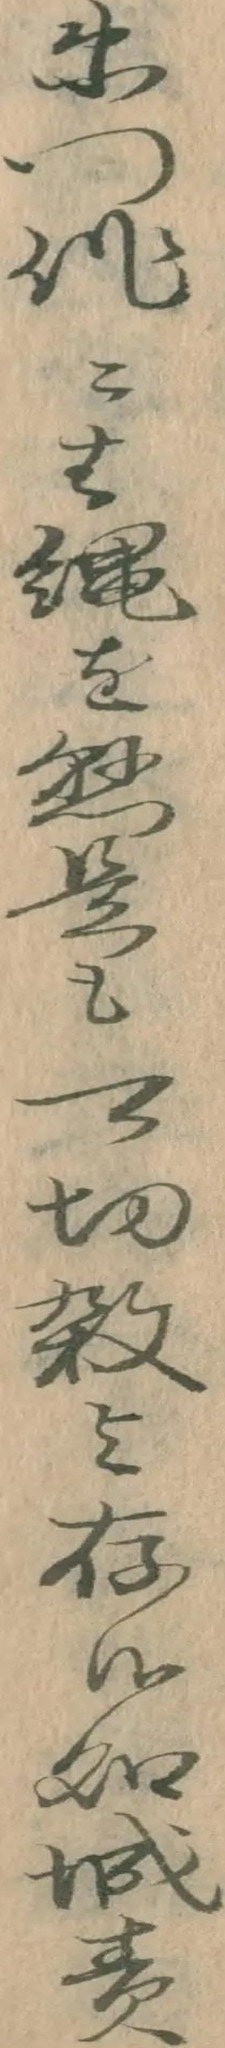衛門作に者縄を懸是も可切殺与存候処城責

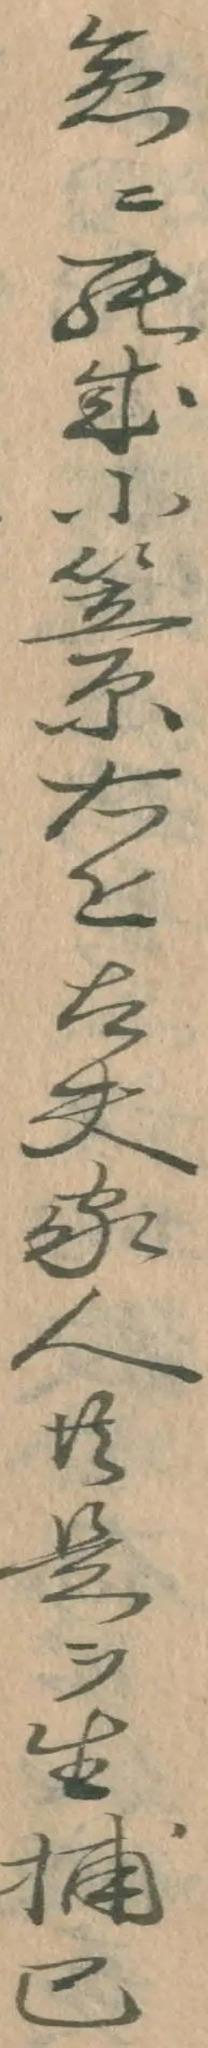急に罷成小笠原右近太夫家人共是を生捕巳
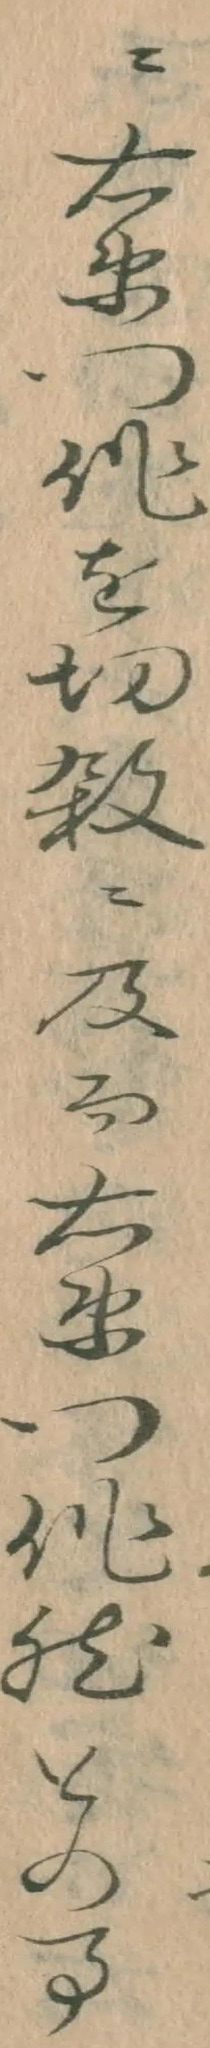に右衛門作を切殺に及而右衛門作然との事
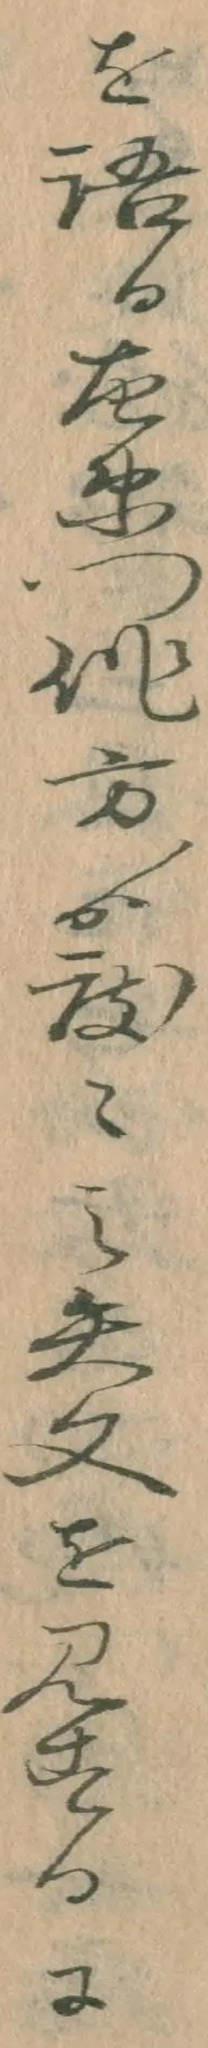を語る左衛門作方ゟ度々之矢文を見春る尓
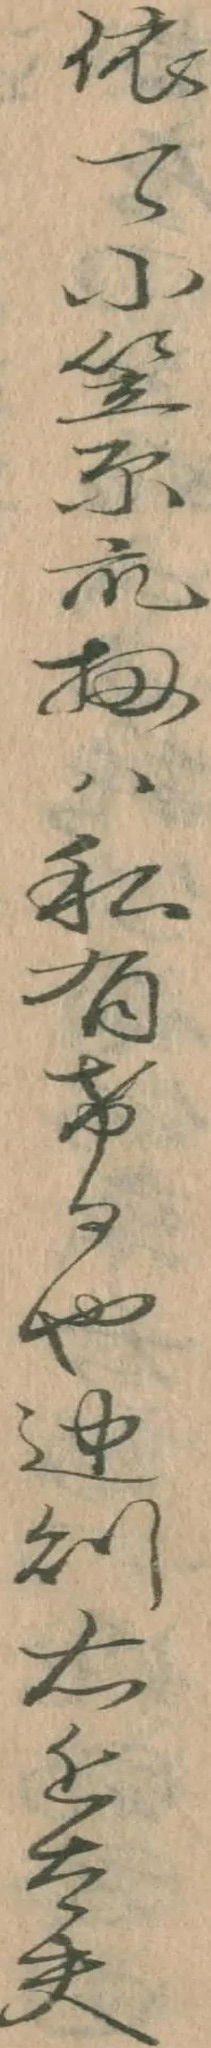依て小笠原衆扨は私有希るや迚則右近太夫
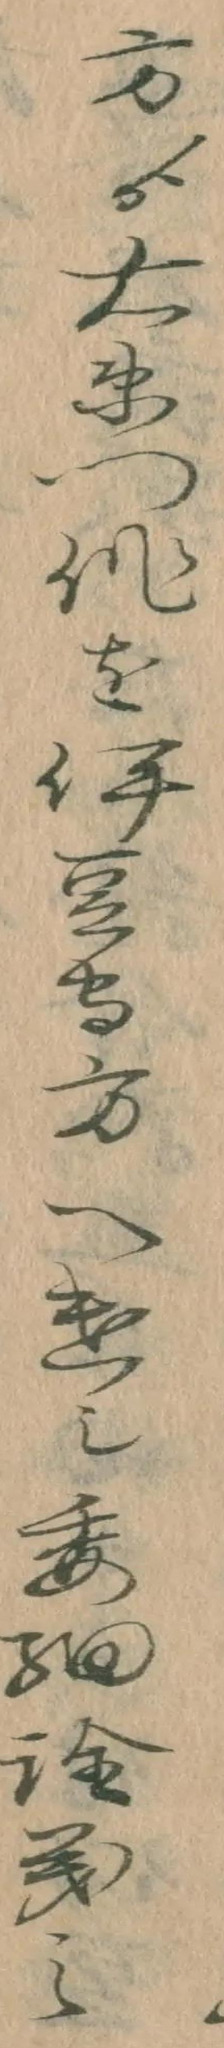方ゟ右衛門作を伊豆守方へ遣し委細詮義之
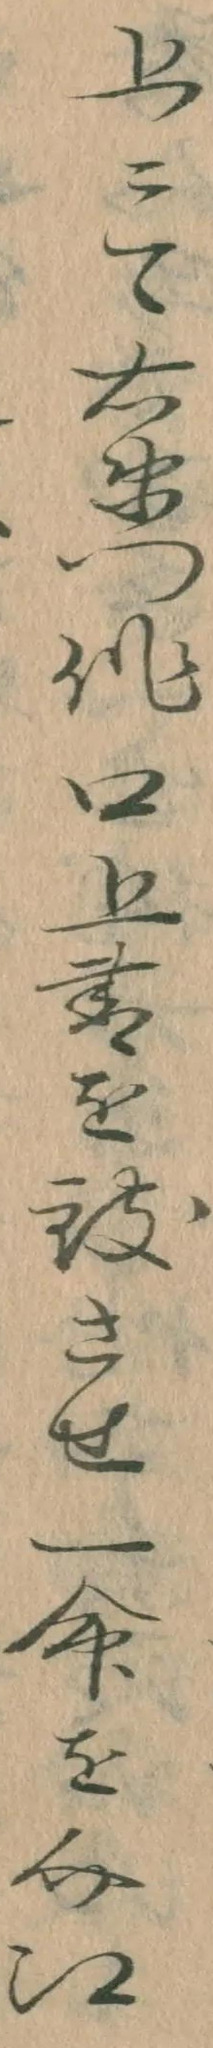上にて右衛門作口上書を致させ一命を介江
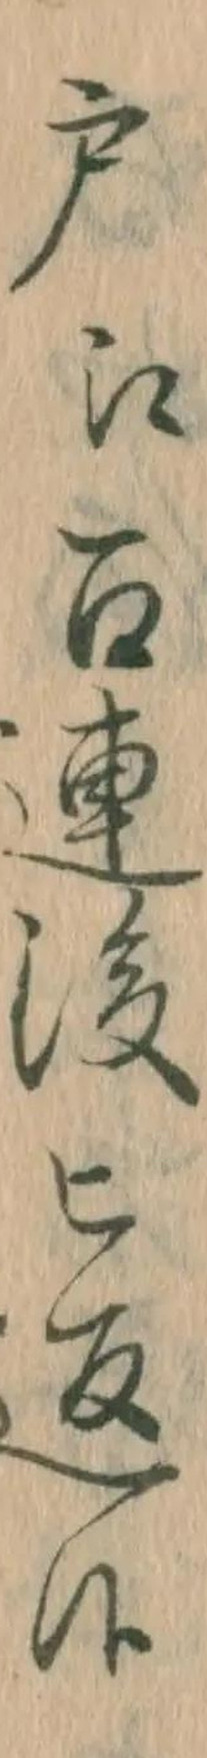戸江召連後被返候
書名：切支丹御退治記 49巻. [7]
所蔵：国立国会図書館 National Diet Library, JAPAN
